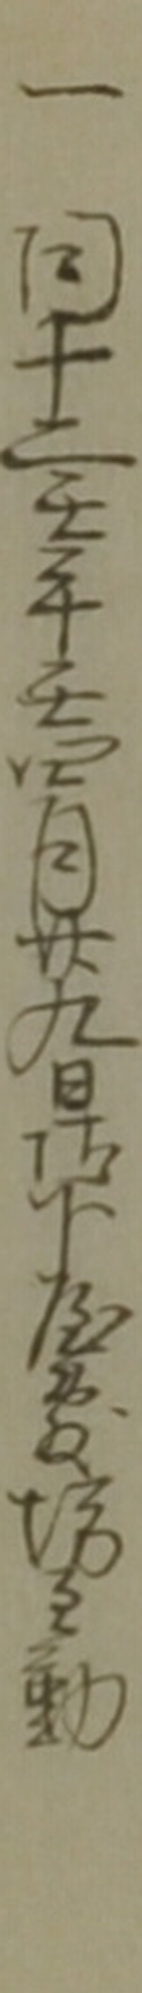一同十二壬午閏四月廿九日御下屋敷坊主勤
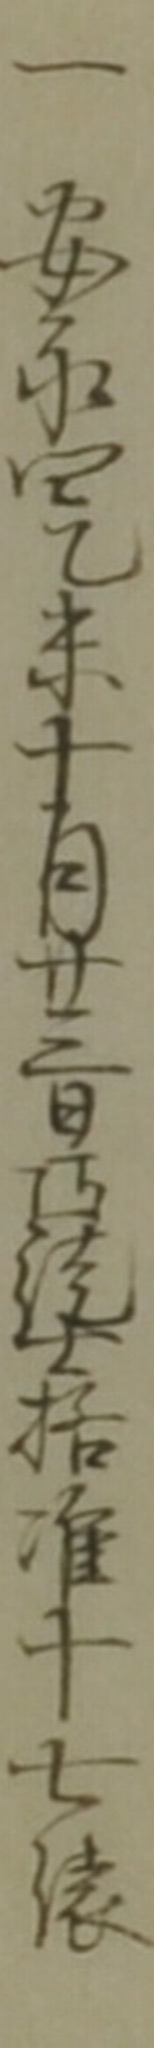一安永四乙未十月廿三日御徒士格准十七俵
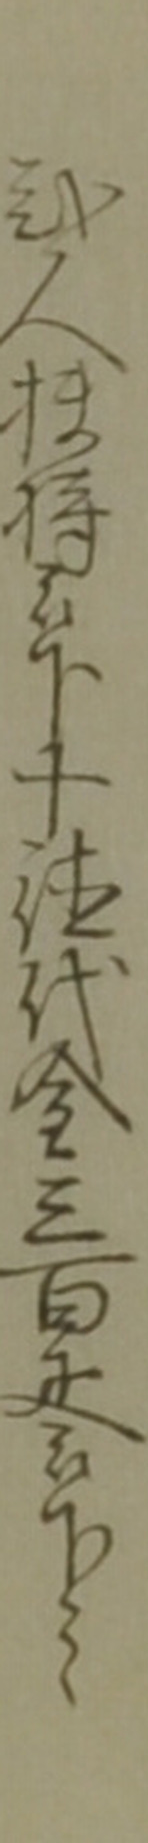弐人扶持被下十徳代金三百疋被下之
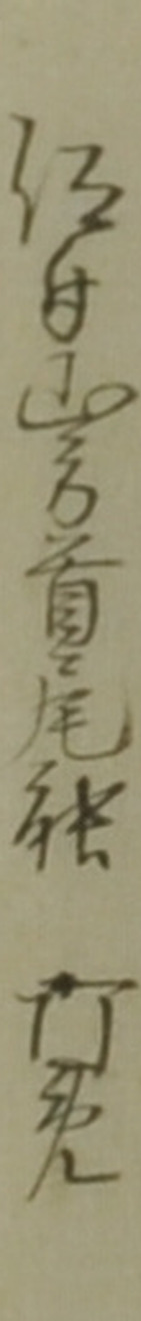仰付山方首尾能御免

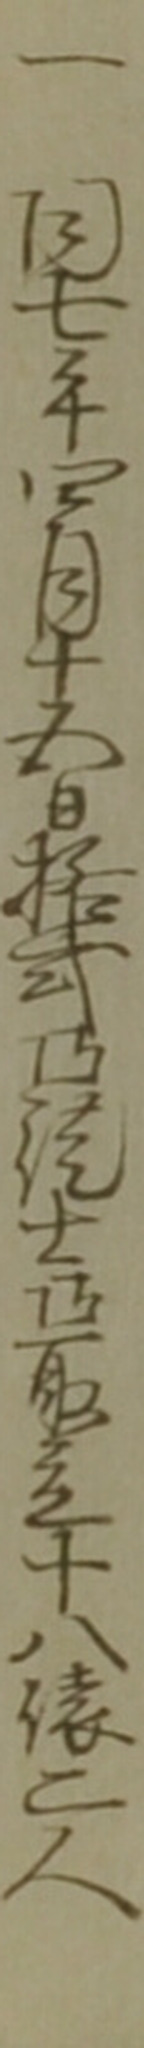一同七午四月十五日格式御徒士御取立十八俵二人
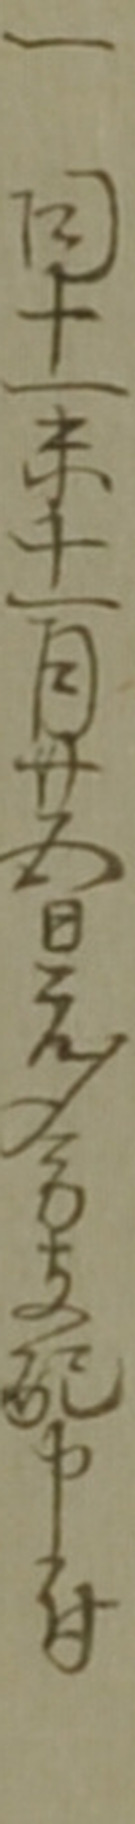一同十一未十一月廿五日元〆方支配申付
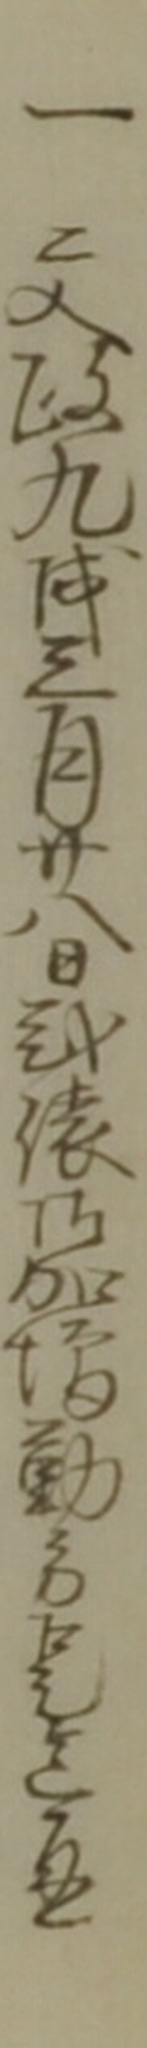一文政九戌三月廿八日弐俵御加増勤方是迄之通
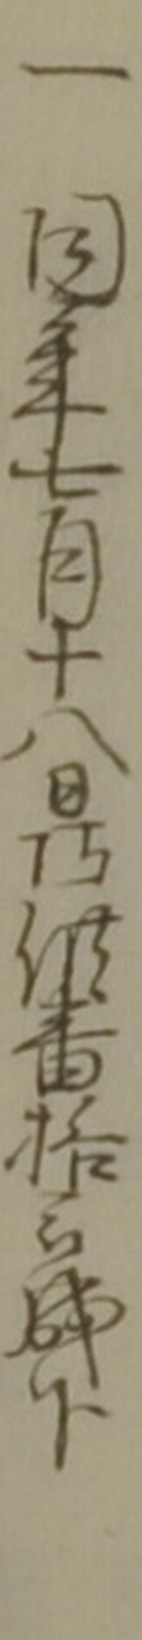一同年七月十八日御供番格被成下

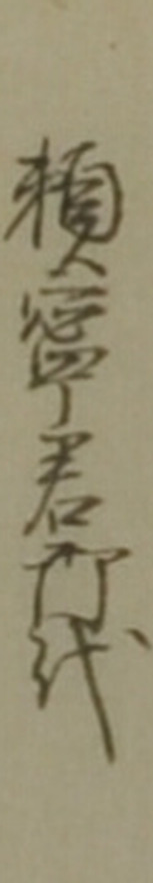頼寧君御代
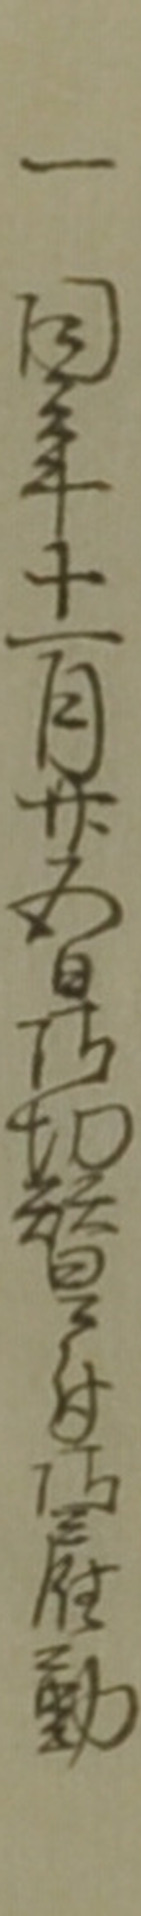一同年十一月廿五日御切替ニ付御雇勤
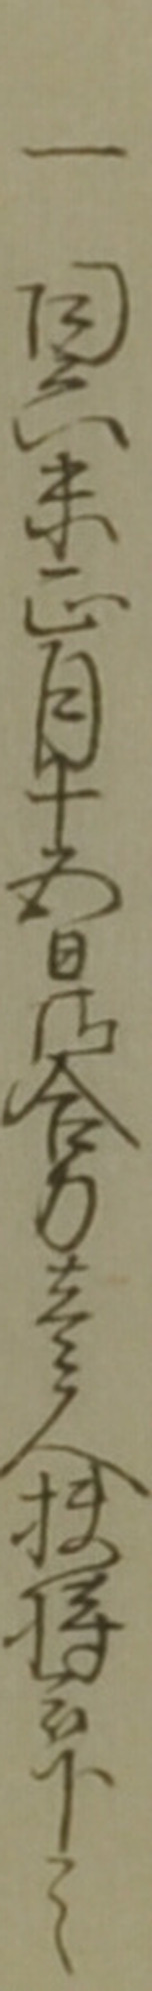一同六未正月十五日御合力壱人扶持被下之
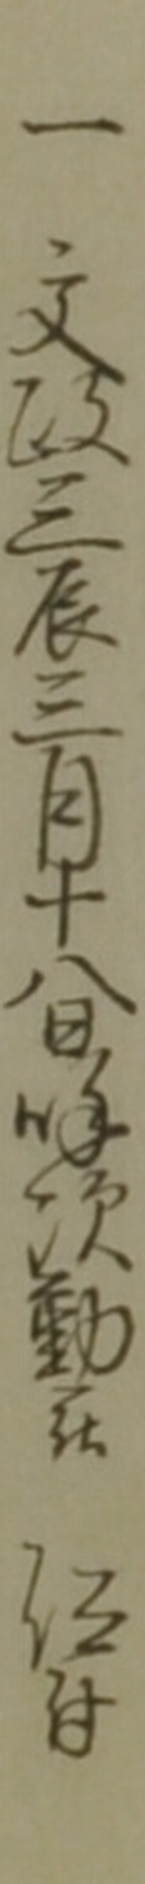一文政三辰三月十八日呼次勤被仰付
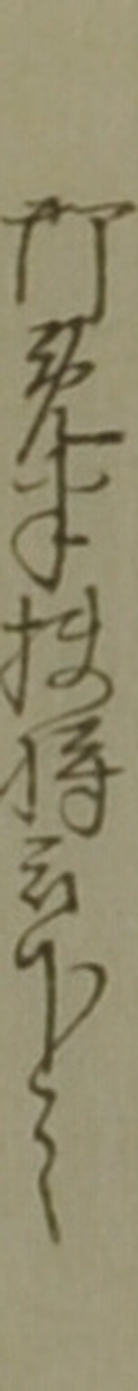御免半扶持被下之
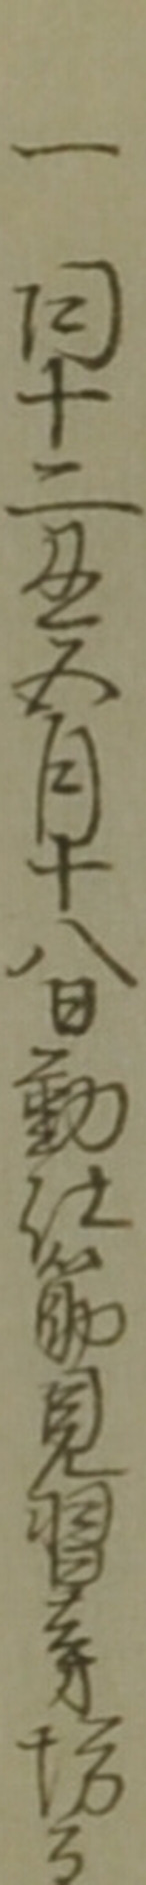一同十二丑五月十八日勤仕筋見習旁坊主助
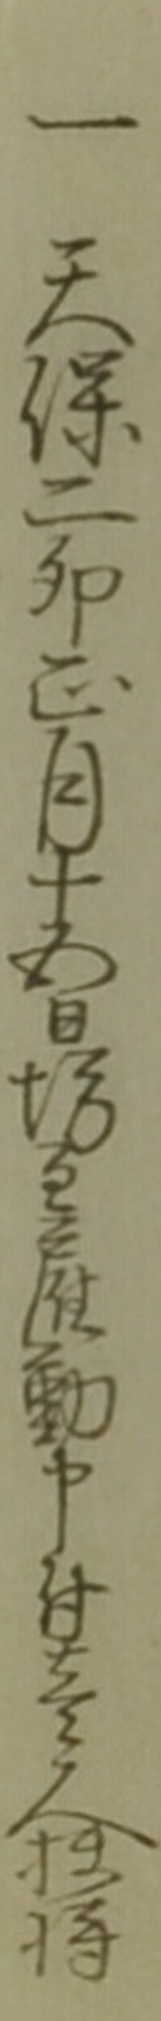一天保二卯正月十五日坊主雇勤申付壱人扶持
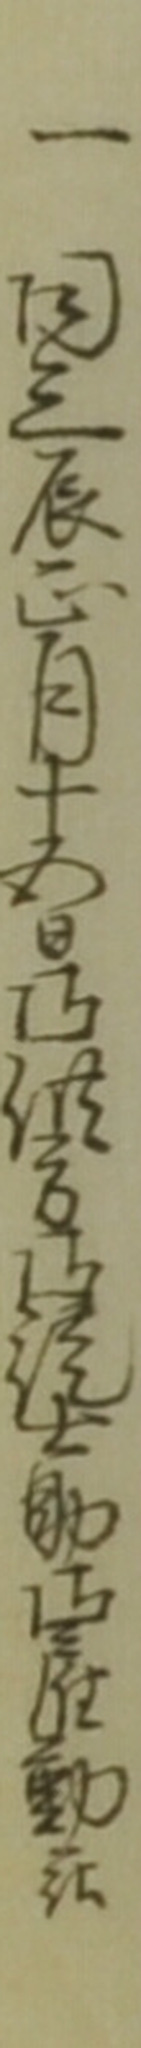一同三辰正月十五日御供方御徒士助御雇勤被
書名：無足諸士勤仕録（六）
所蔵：伊那市立高遠町図書館・合同会社AMANE
